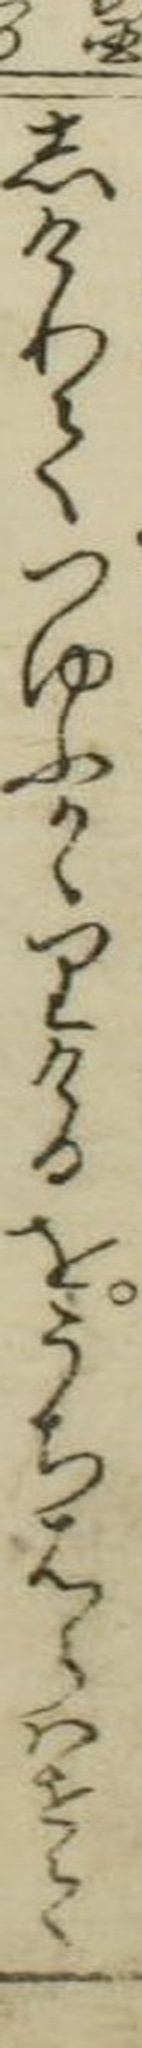しけりてつゆふかゝりけるを。うちはらはせて
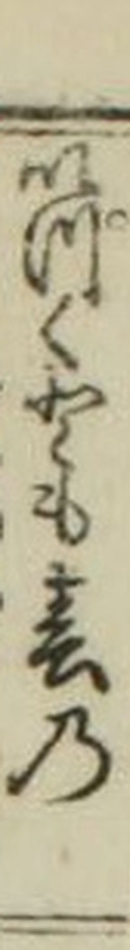いづくとも春の
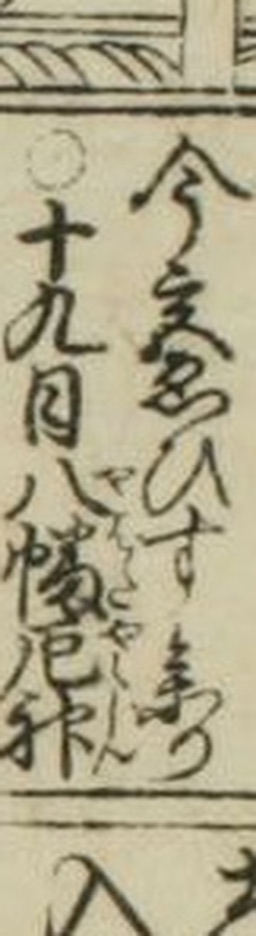○十九日八幡厄神
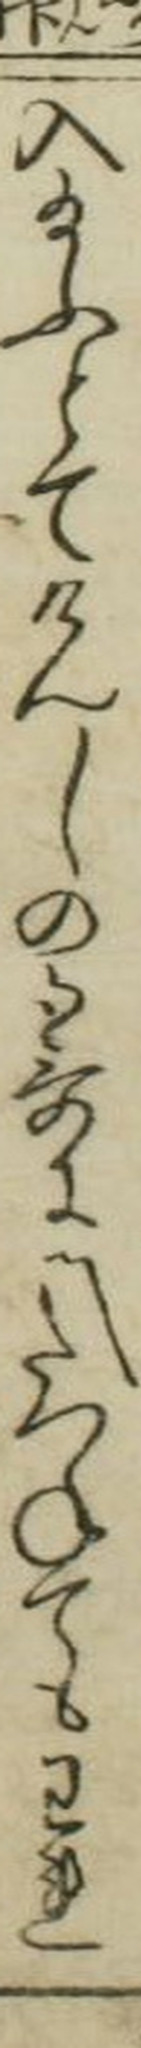入給ふとてけんしの御哥に〽たつねてもわれ
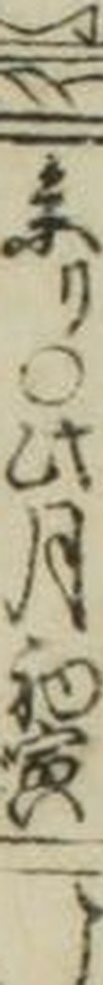参り○此月初寅
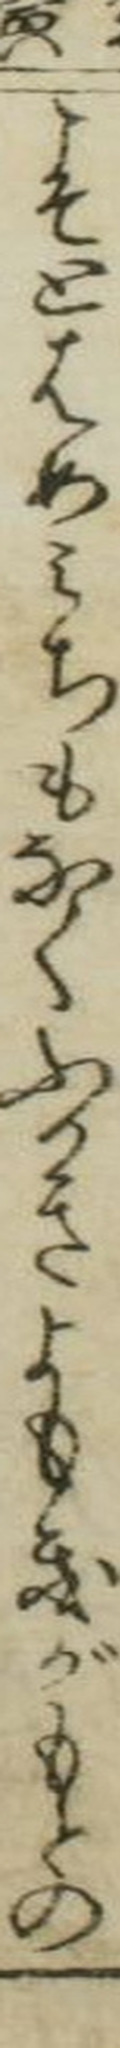こそとはめみちもなくふるきよもきがもとの
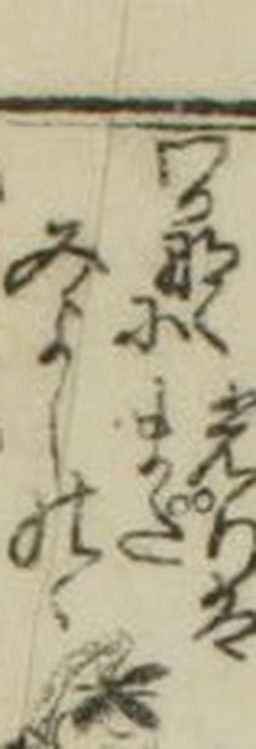みよしのゝ
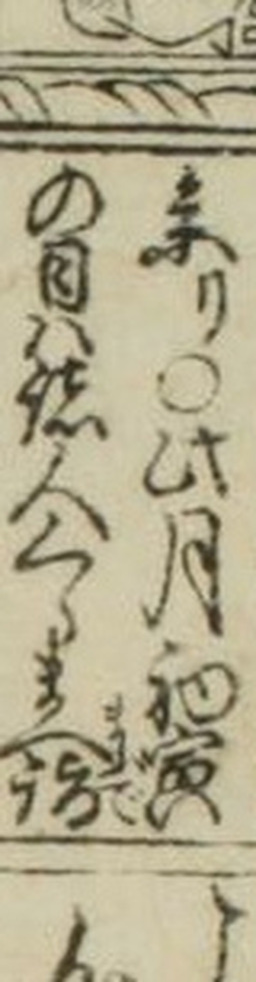の日は諸人くらまへ詣
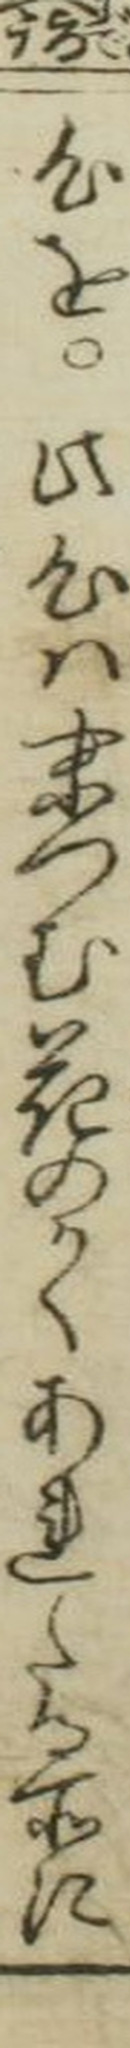心を○此心は末つむ花のかくあれたる所に
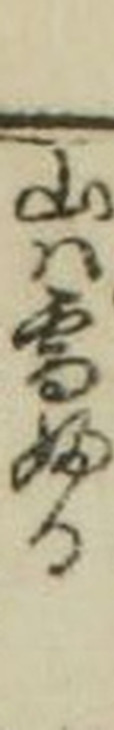山は雪ふる
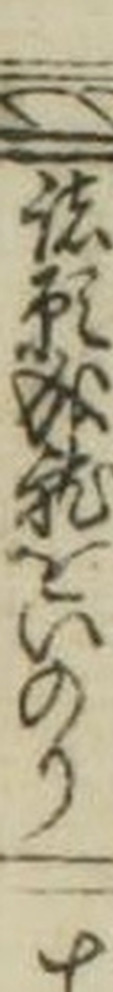諸願成就をいのり
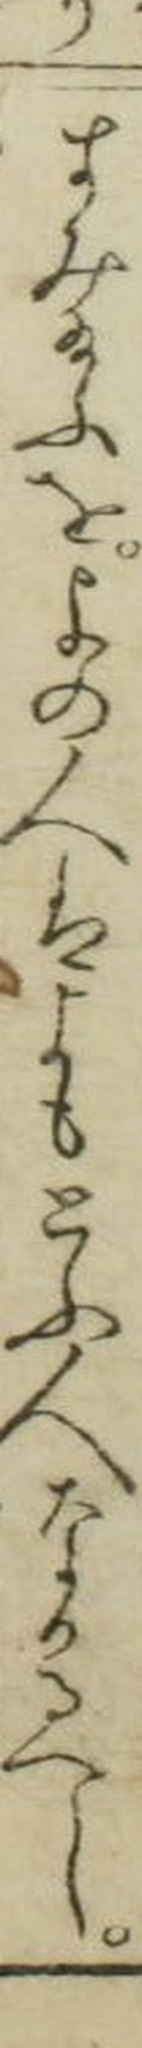すみ給ふを。よの人はよもとふ人なかるへし。
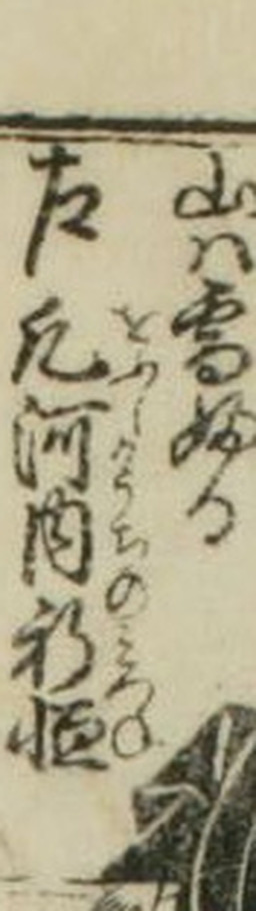左凡河内躬恒
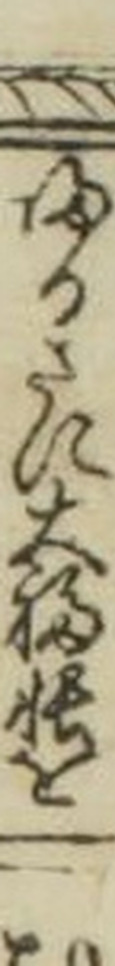帰るさに大福帳を
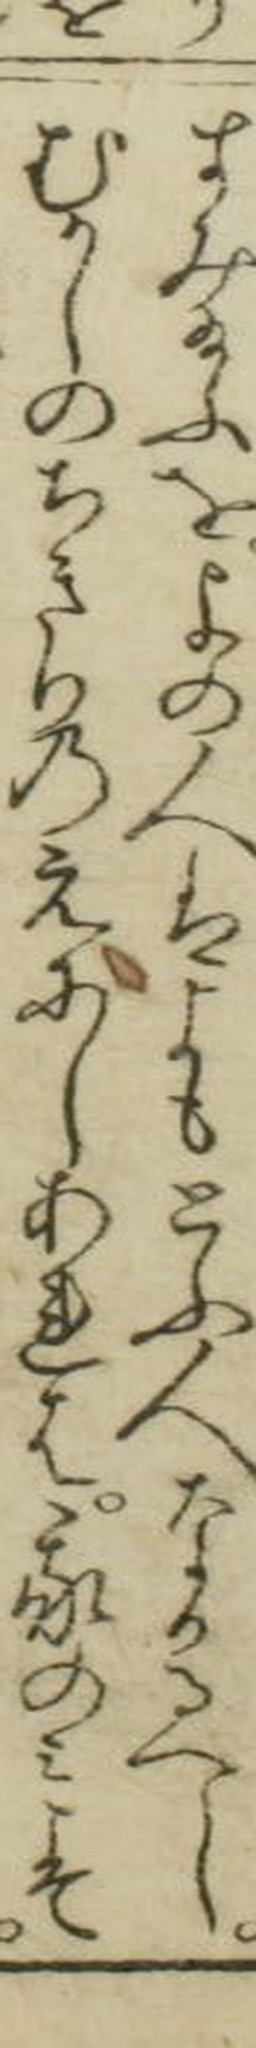むかしのちきりのえにしあれは。我のみこそ
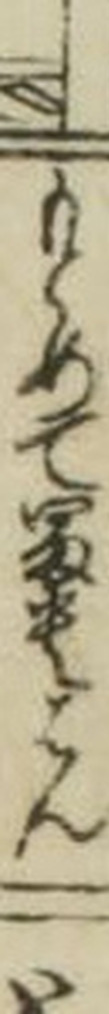もとめて富貴はん
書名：女源氏教訓鑑
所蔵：東京学芸大学附属図書館
